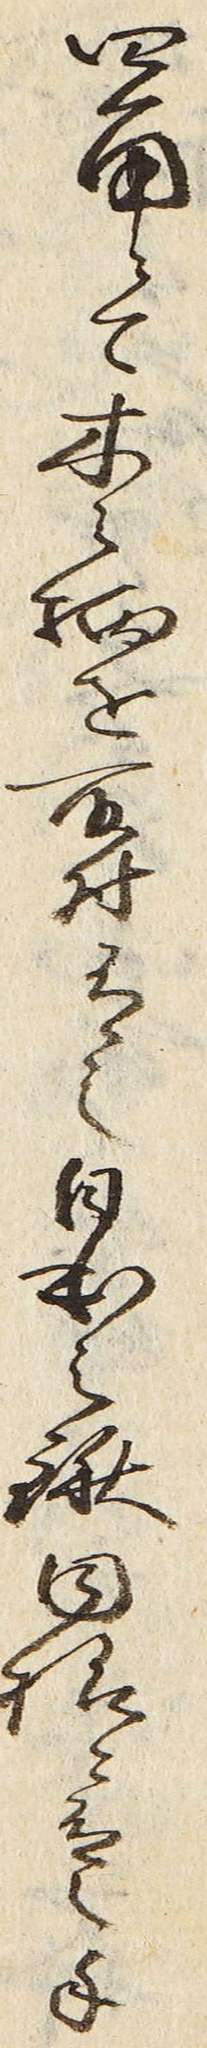四角にて木之柄を取付有之日本之鍬同様に有之手
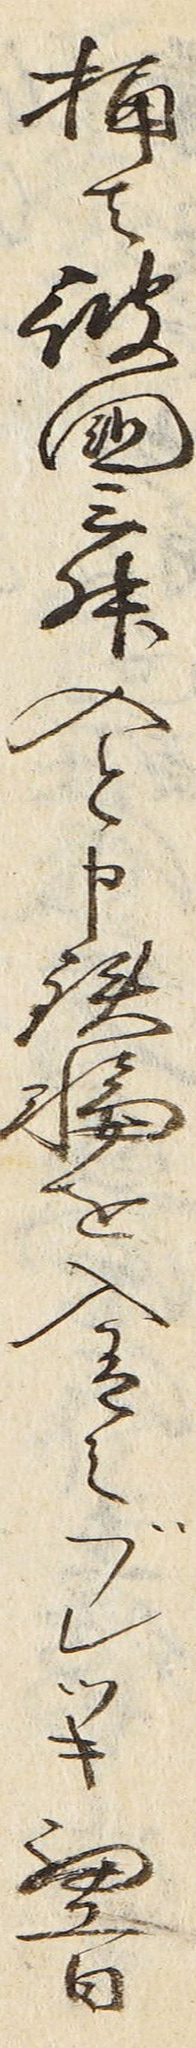桶は彼国三升入と申鉄輪を入有之ブレツキ細工日
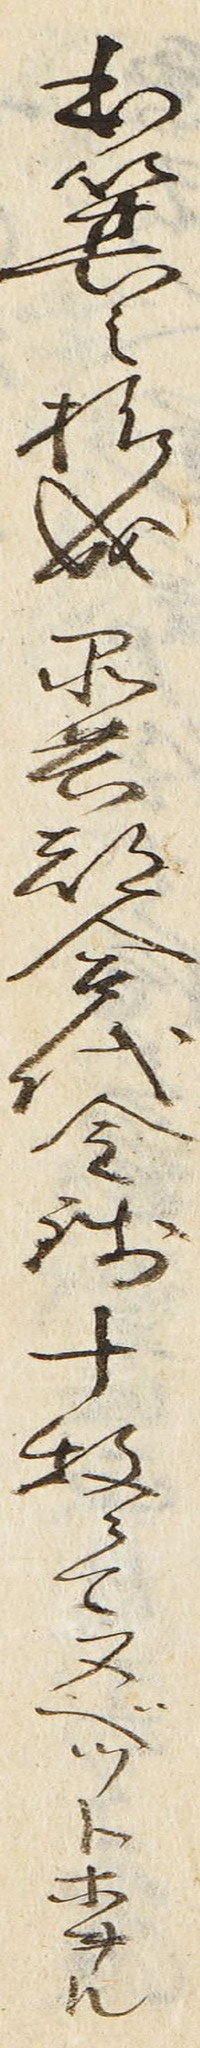本箕之様成品共都合代金銭十枚にてヌベツトホヲル
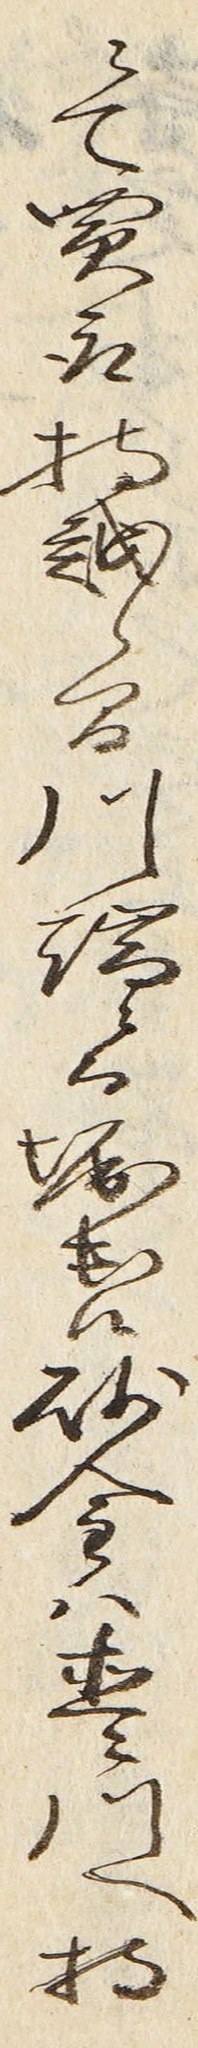にて買取持越候間川端に而掘出候砂金は直に川へ持
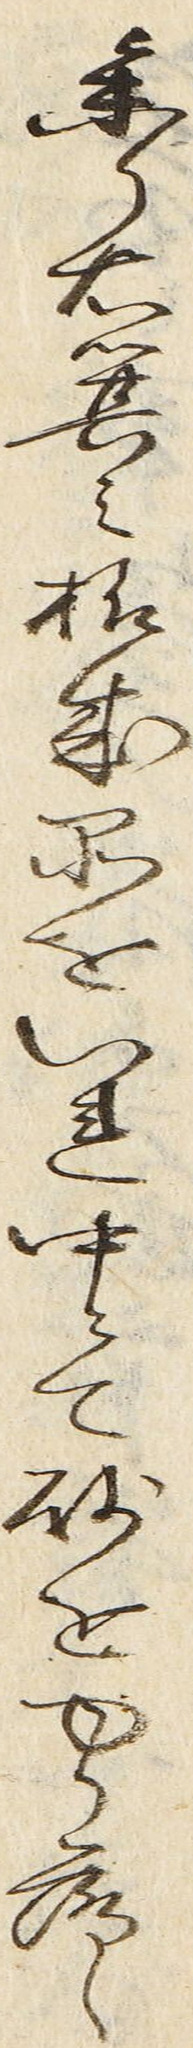参り右箕之様成品をいれ中にて砂をゆり落し
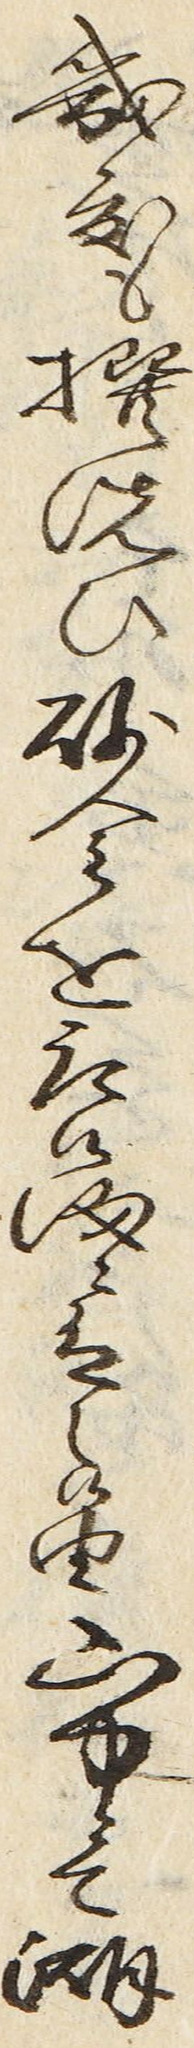幾度も撰洗ひ砂金を取候儀に有之候由山中にて湖
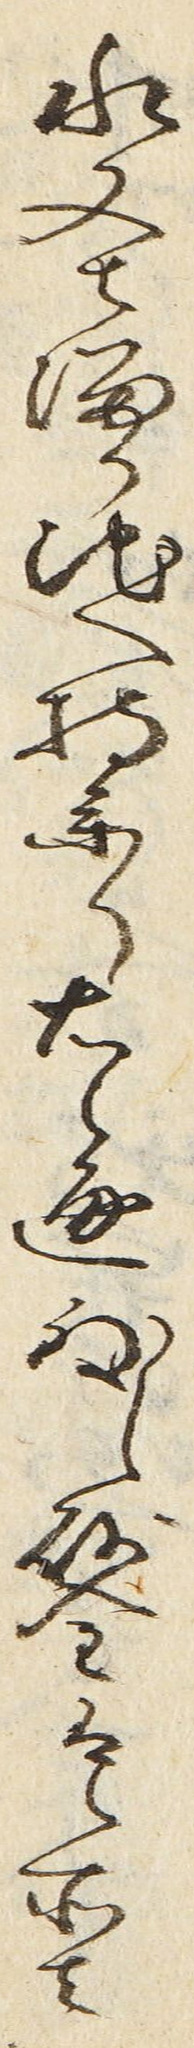水又は溜り池へ持参り右之通致し砂金有之所は
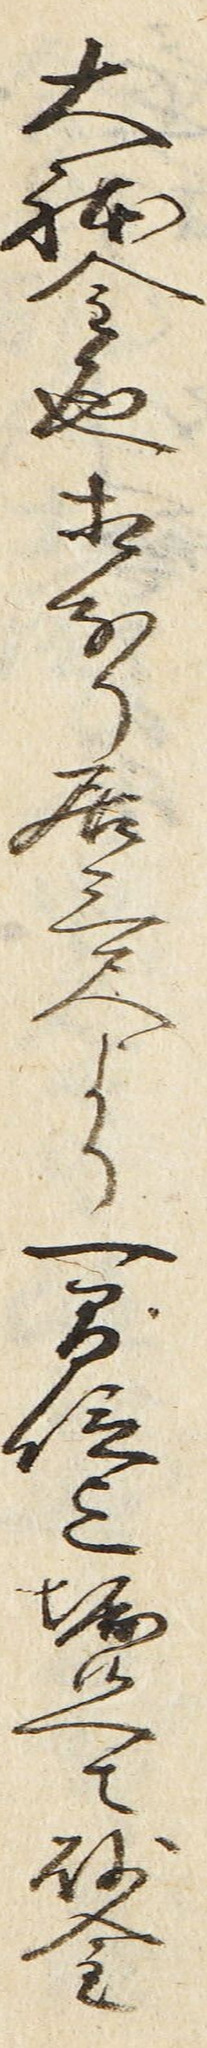大躰金也相なり居三尺より一謙間位迄掘候へは砂金
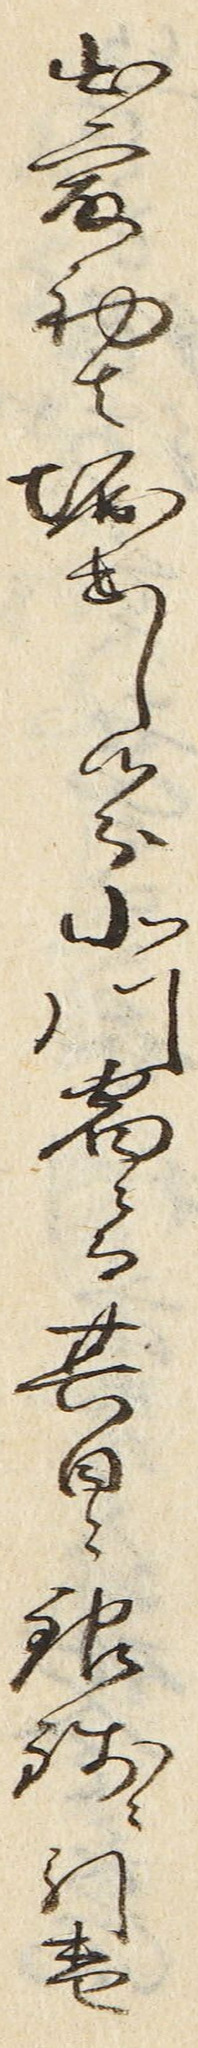出最初は掘出し候分北川宿に而其日々銀銭に引替

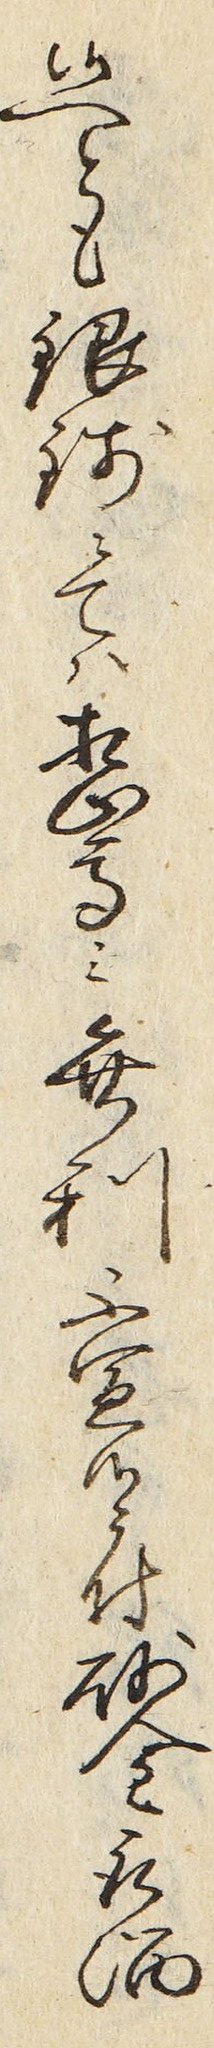候へとも銀銭にては相嵩み弁利不宜候に付砂金取溜
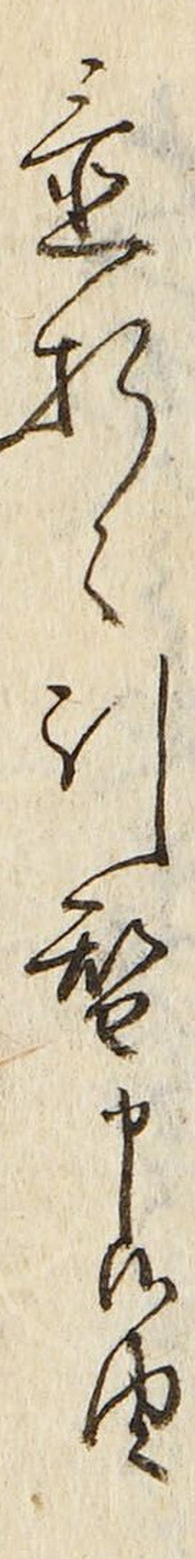置折々引替申候由
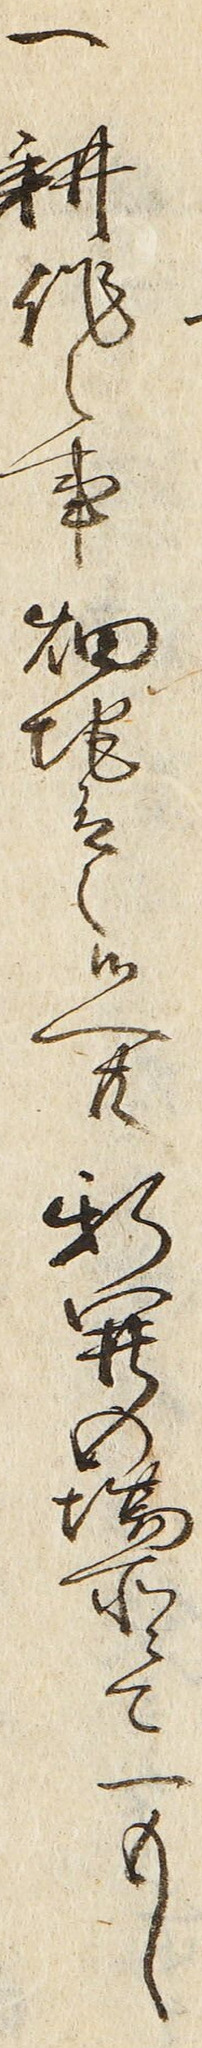一耕作之事畑地有之候へ共新開の場所にて一もし
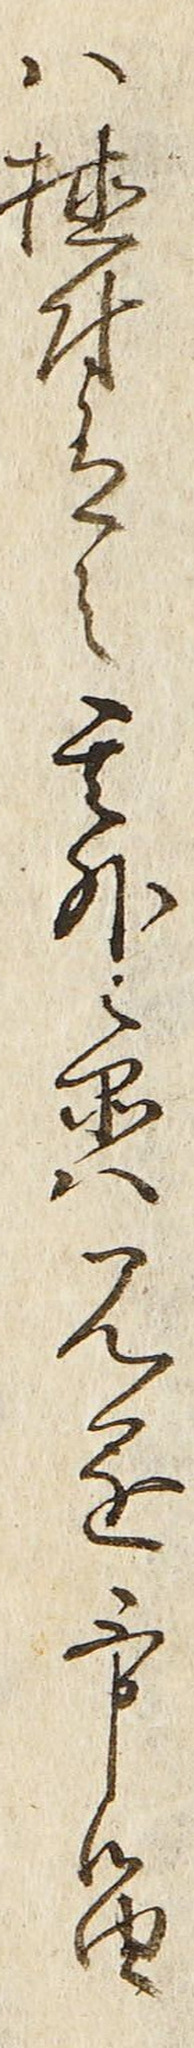は植付有之其外之品は見懸不申候由
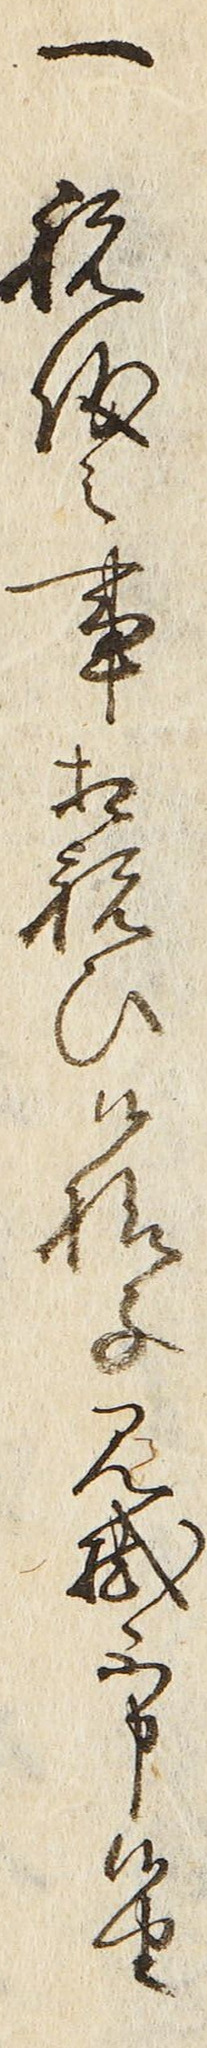一祝儀之事相祝ひ候様子見掛不申候由
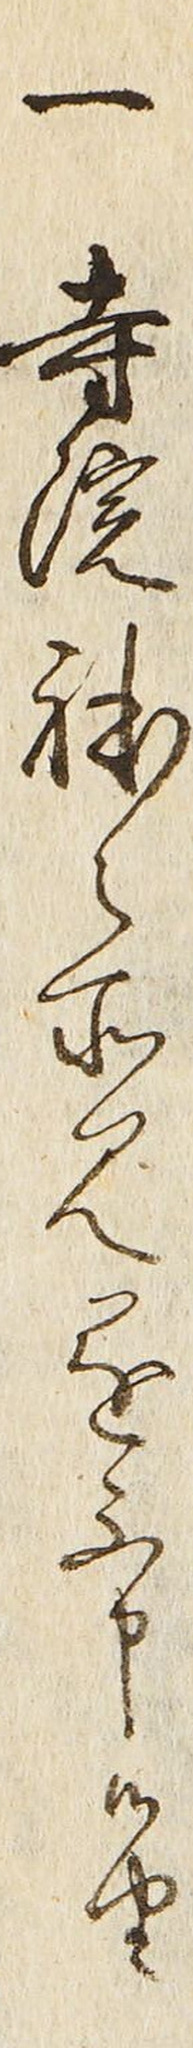一寺院躰之所見懸不申候由
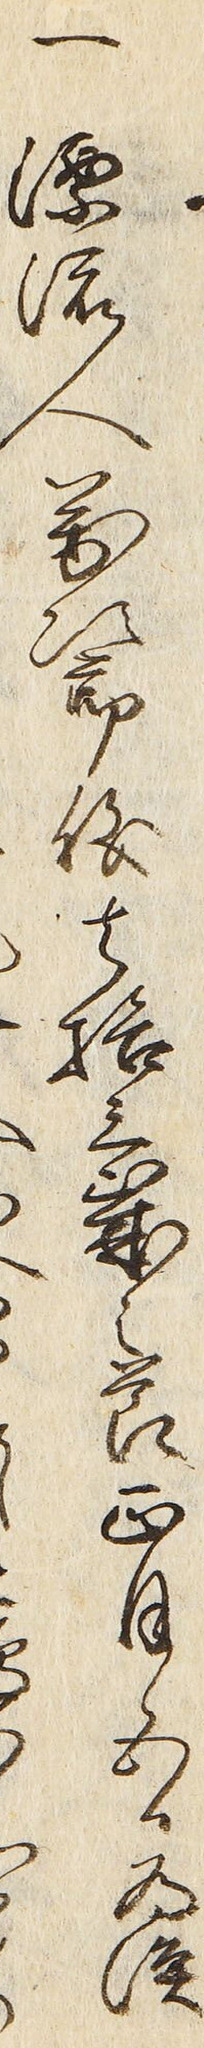一漂流人万次郎儀は拾三歳之節正月五日為漁
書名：土佐中浜万次郎漂流記
